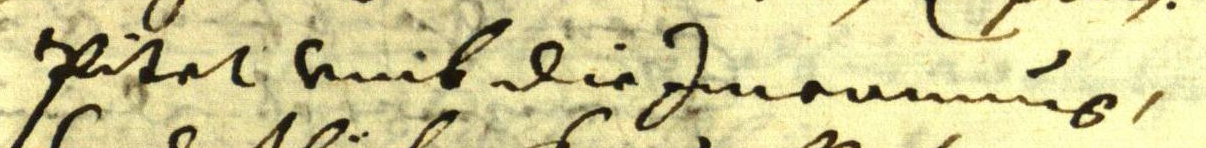Pitet umb die Inwonūng,
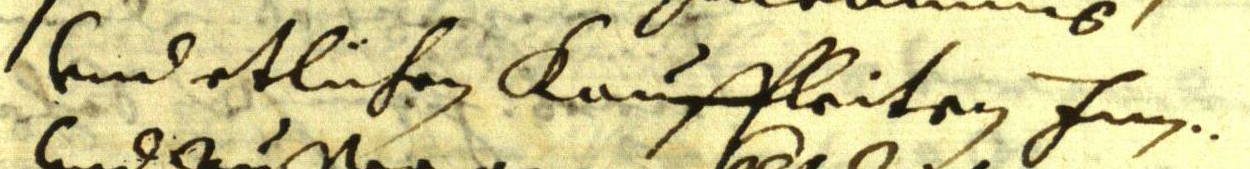vnd etlichen Kaūffleiten Inn¬
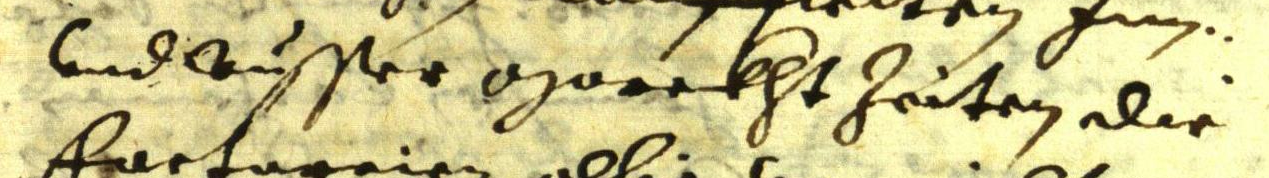vnd Aūsser Marckht Zeiten die
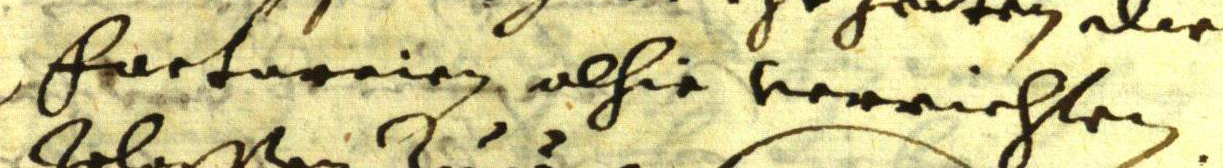Factoreien alhie verrichten
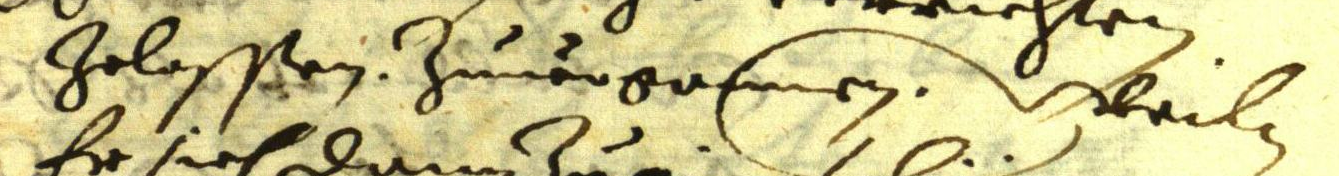Zelassen. Zūuērgonnen. Weiln
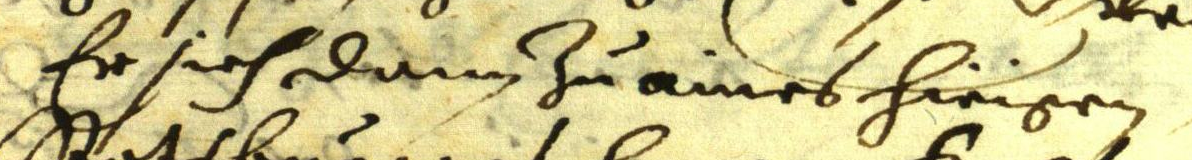Er sich dann Zū aines hieigen
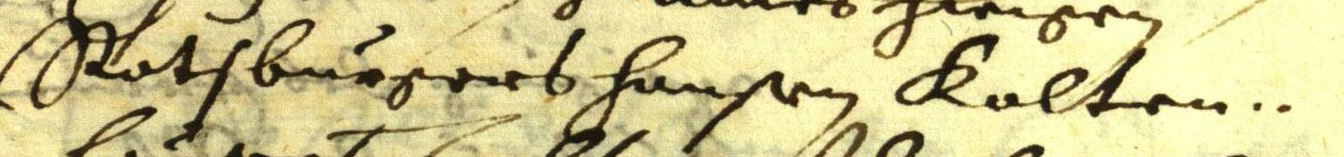Ratsbūrgers hansen Kalten¬
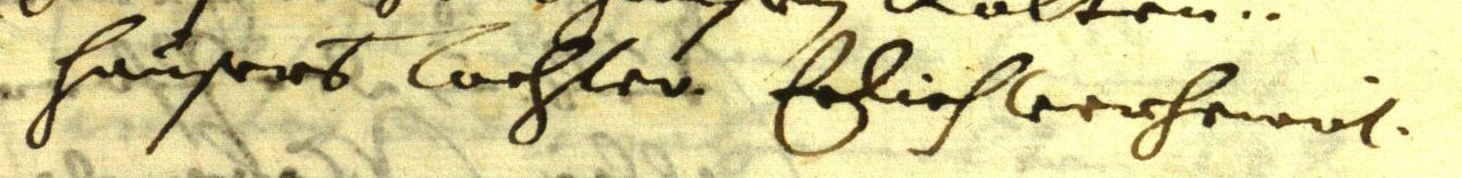haūsers Tochter Eelich verheirat.
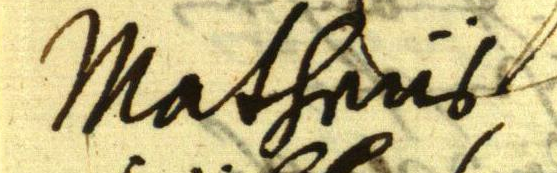Matheüs
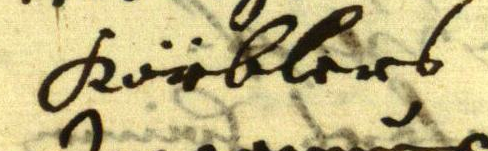Körblers
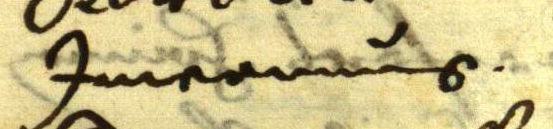Inwonūng.
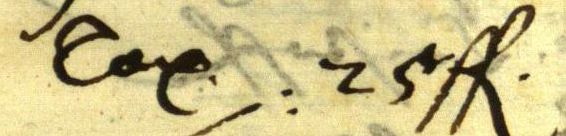Tax —: 25 fl.
